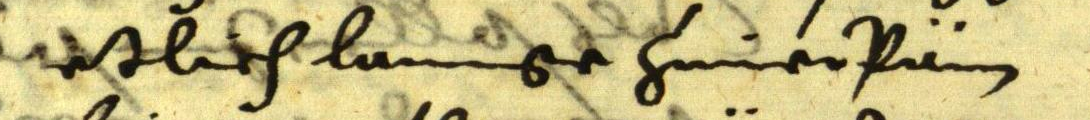etlich lannge Zimer Päm
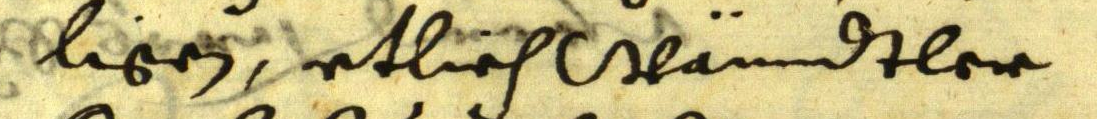ligen, etlich Wänndtler
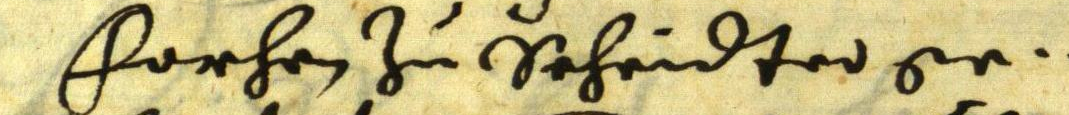Forhen Zū Scheidter ge¬
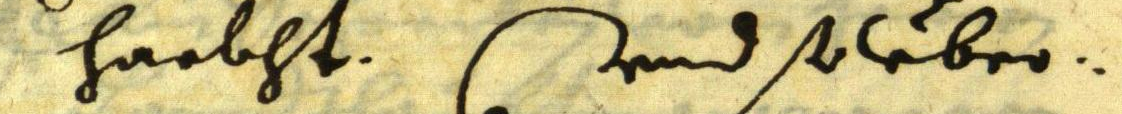hackht. Vnnd so v̄ber¬
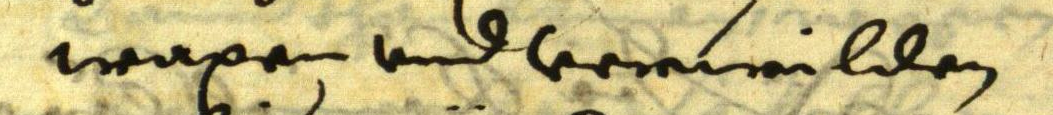waxen vnd verwilden
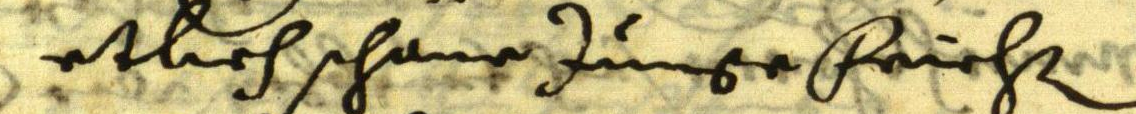etlich schöne Jūnge Feicht
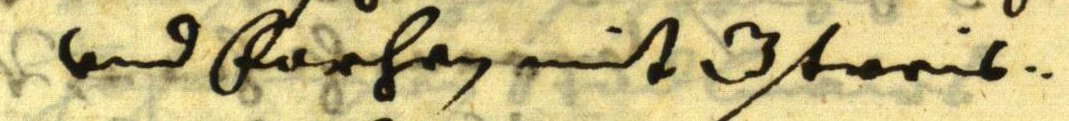vnd Forhen mit Gstreis¬
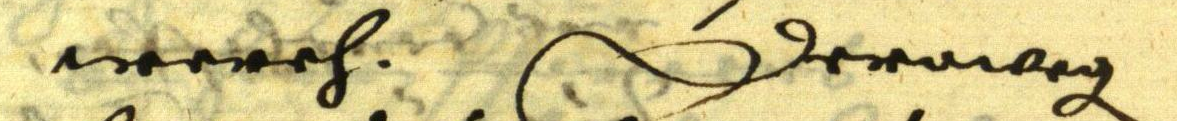werch. Deroweg
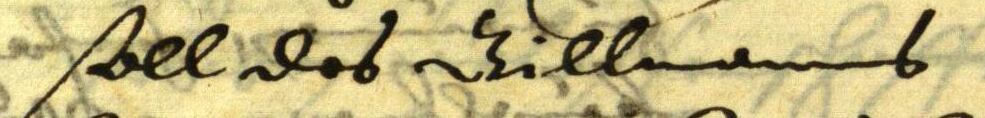sol des Gillmanns
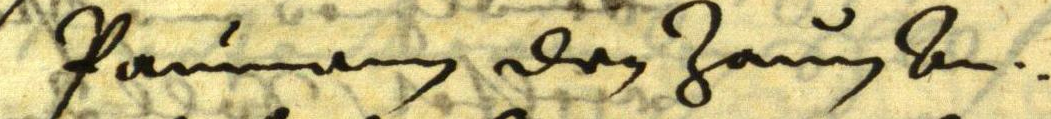Paūmann den Zaūn An¬
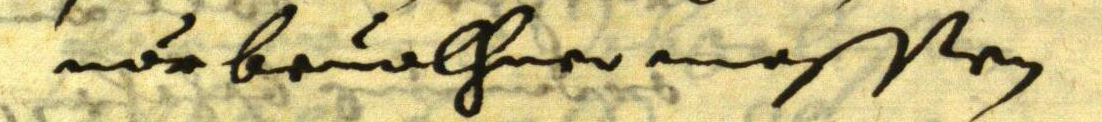vor beūolhner massen
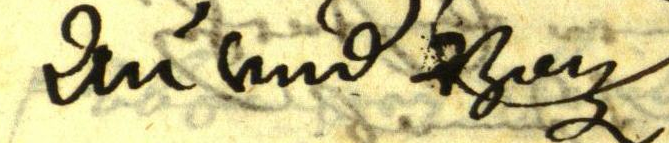Aū vnd Boz
